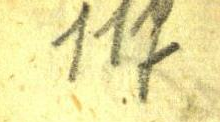117
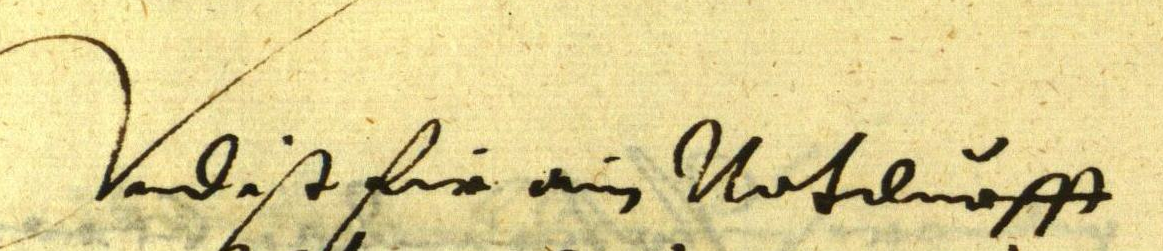Vnd ist fir ain Notdūrfft
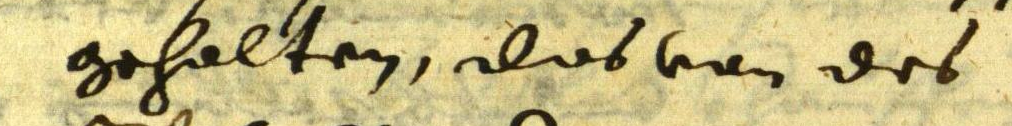Gehalten, das von des
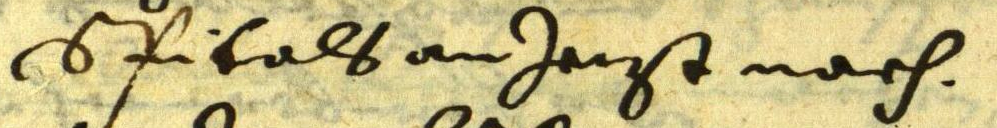SPitals an Jezt nach.
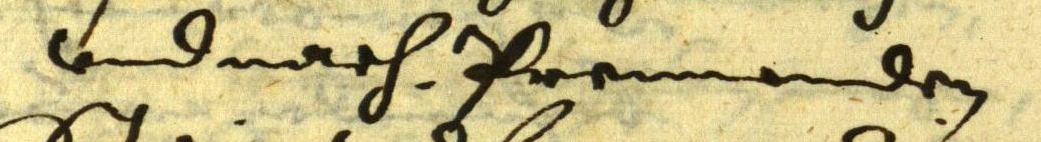vnd nach Prennenden
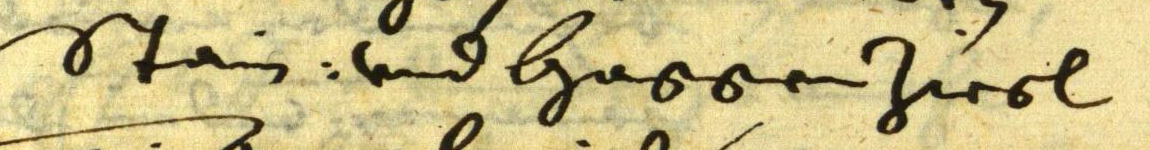Stain: vnd Haggen Ziegl
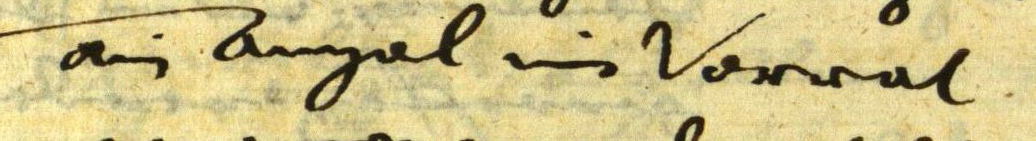ain Anzal im Vorrat
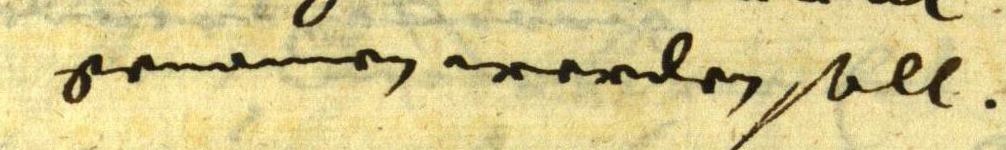genomen werden soll.
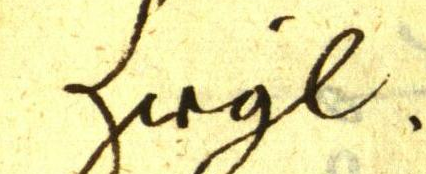Ziegl.
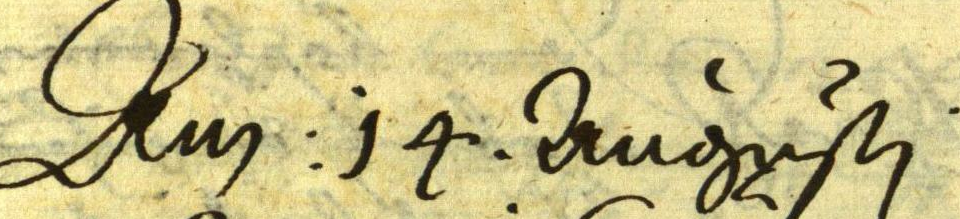Am: 14. Aūgūstj
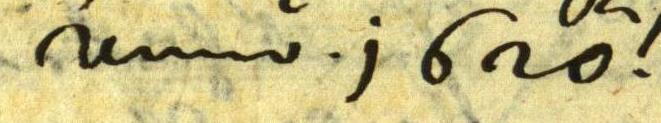Anno .1620.t
